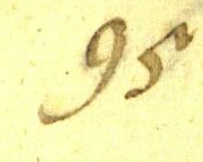95
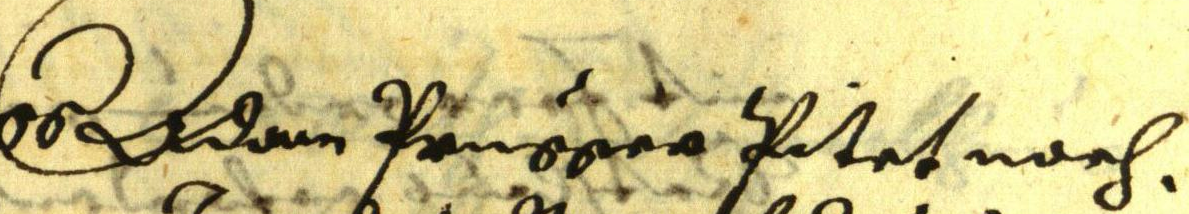Adam Prūgger Pitet noch.
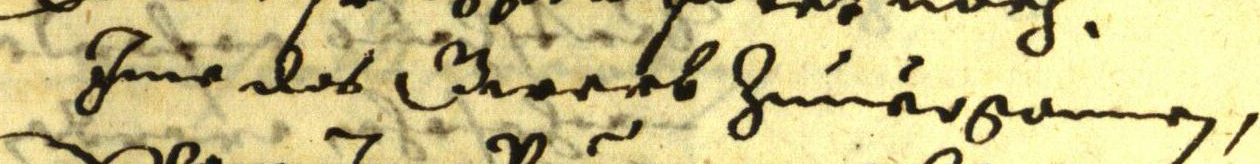Ime das Gwerb Zūūergonnen,
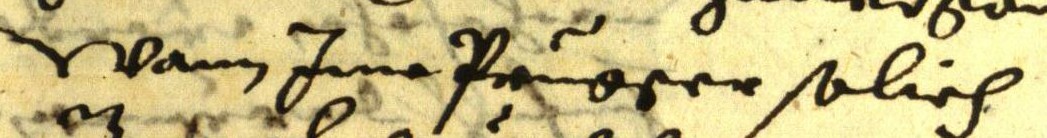Wann Ime Prūgger solich
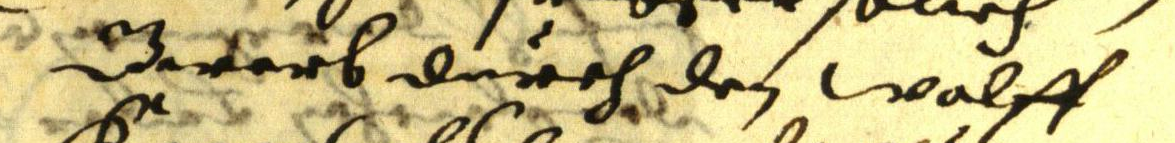Gwerb dūrch den Wolff
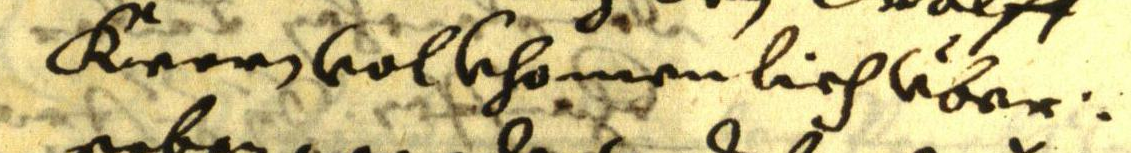Kerrn volkhomenlich v̄ber¬
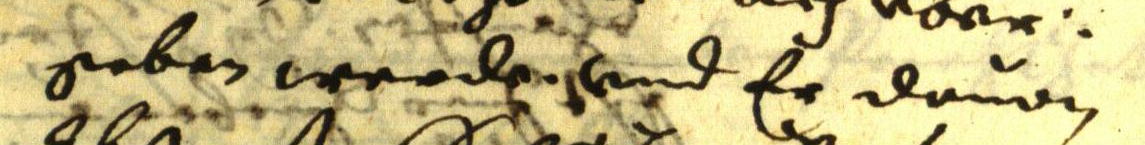geben werde. vnd Er daūon
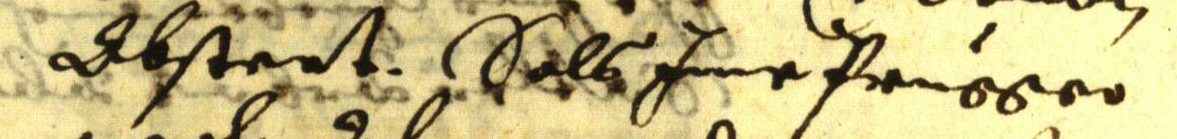Absteet. Sols Ime Prūgger
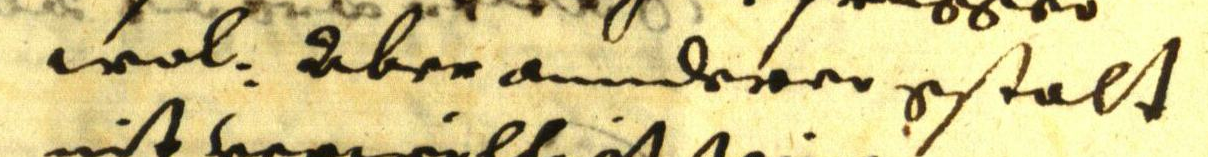wol: Aber anndrer gstalt
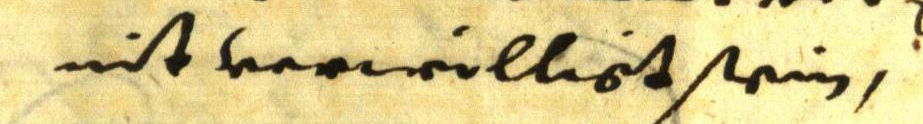nit verwilligt sein,
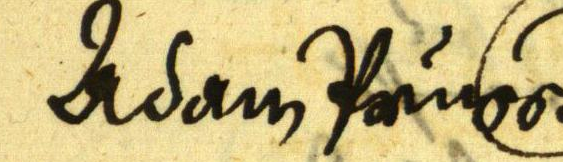Adam Prūgg
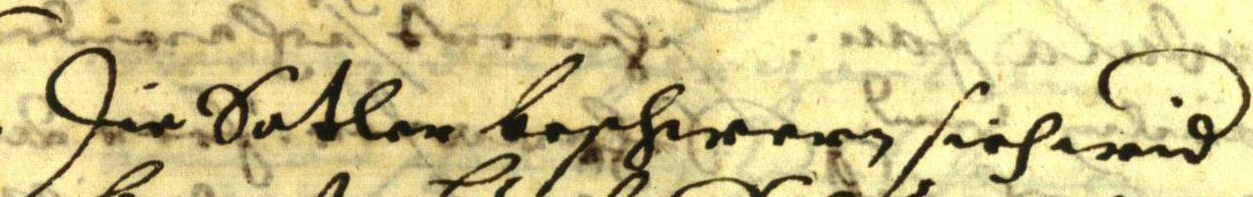Die Satler beschwern sich wid
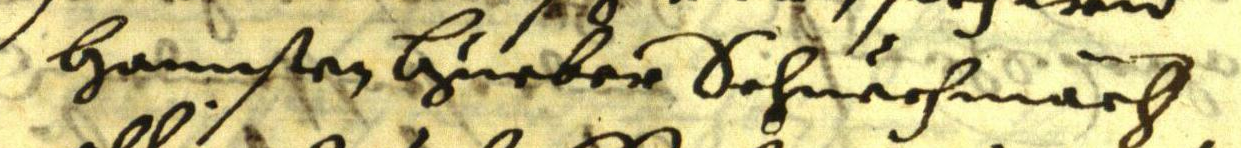Hannsen Hūeber Schūechmach
